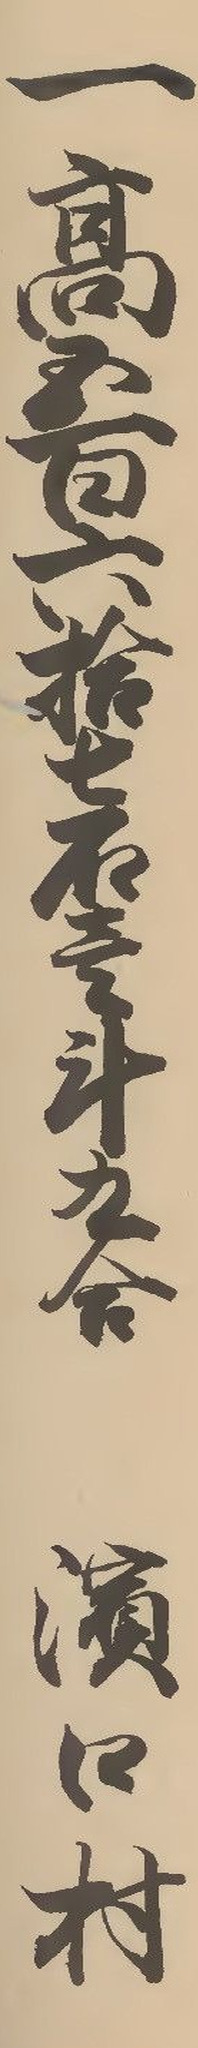一髙五百六拾七石壱斗九合濱口村
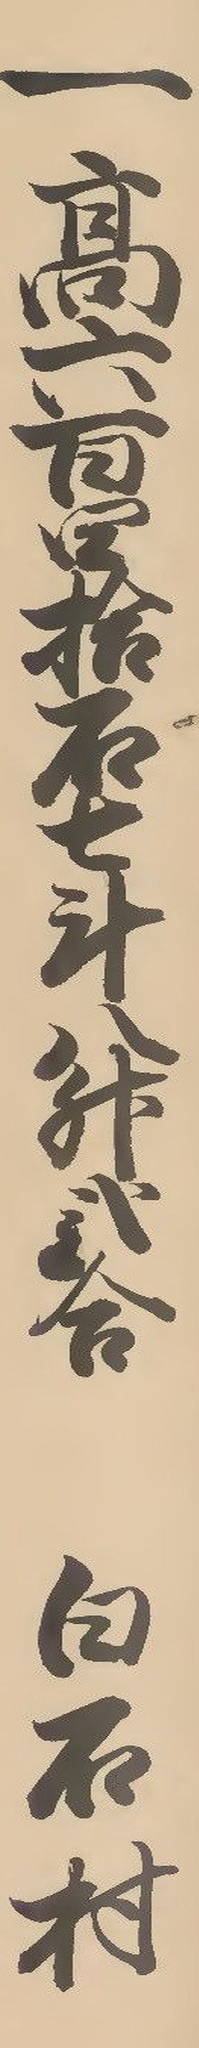一髙六百四拾石七斗八升弐合白石村
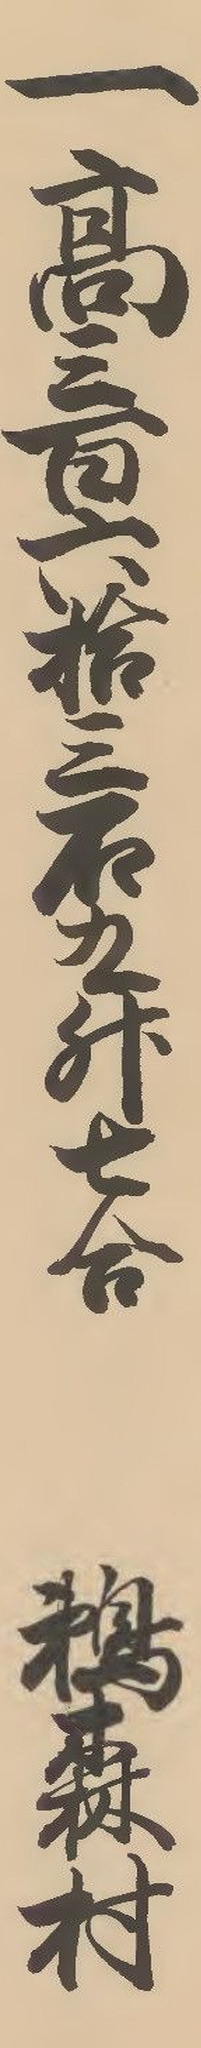一髙三百六拾三石九斗七合鵜森村
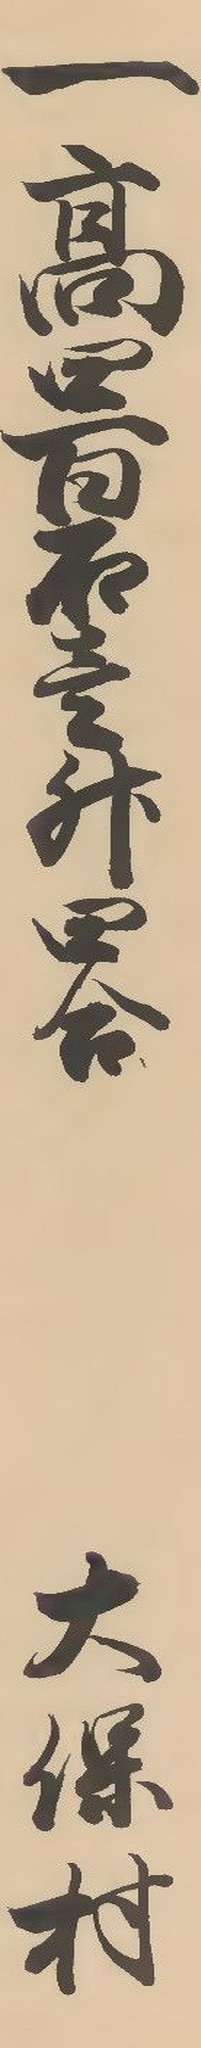一髙四百石壱升四合大保村
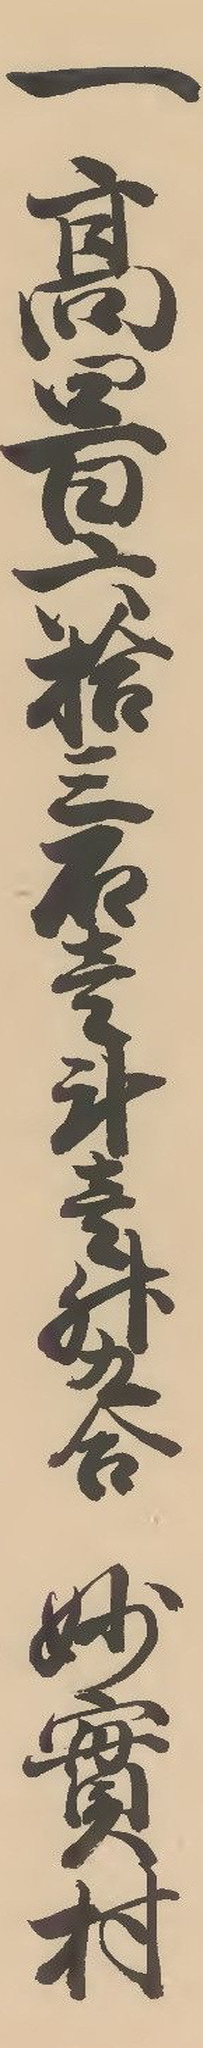一髙四百六拾三石壱斗壱升九合妙實村

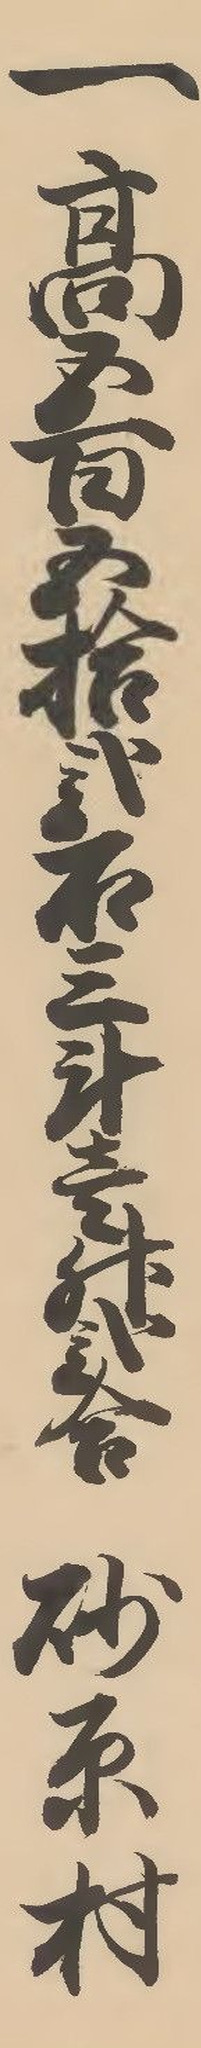一髙五百五拾弐石三斗壱升弐合砂原村
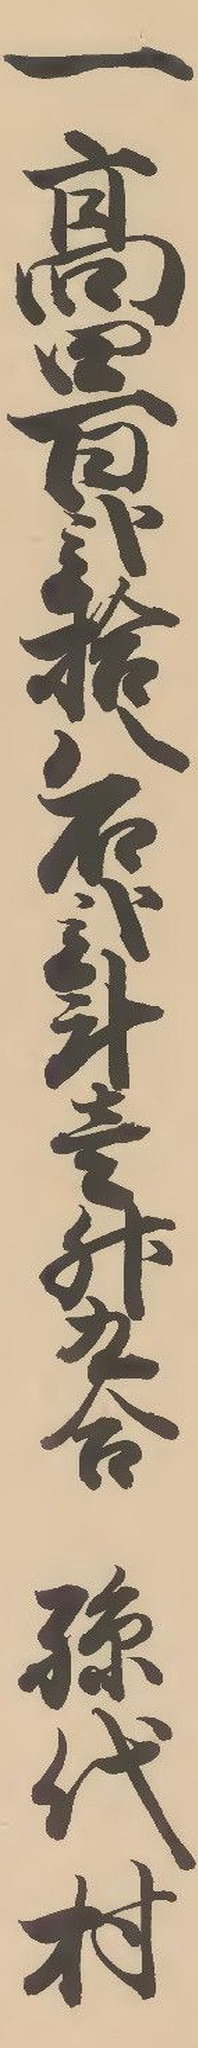一髙四百弐拾八石弐斗壱升九合孫代村
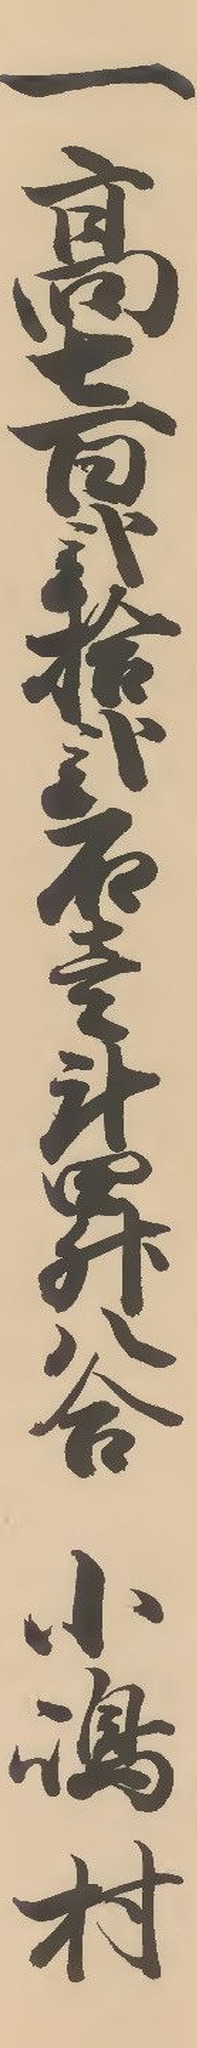一髙七百弐拾弐石壱斗四升八合小嶋村
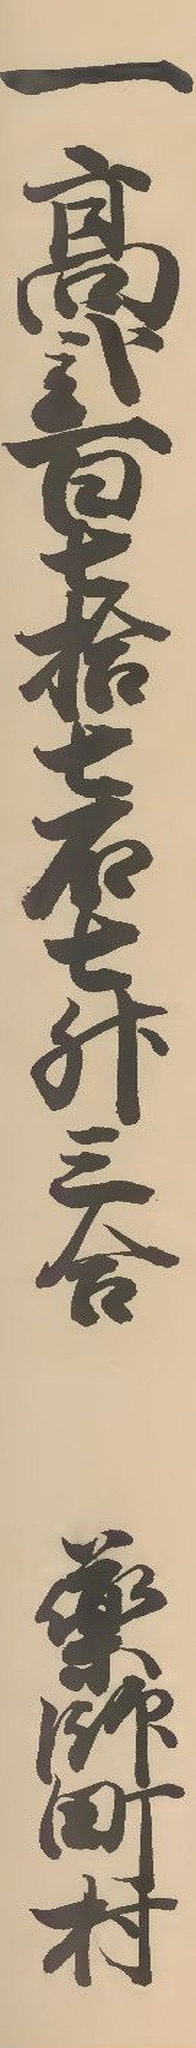一髙弐百七拾七石七升三合藥師町村
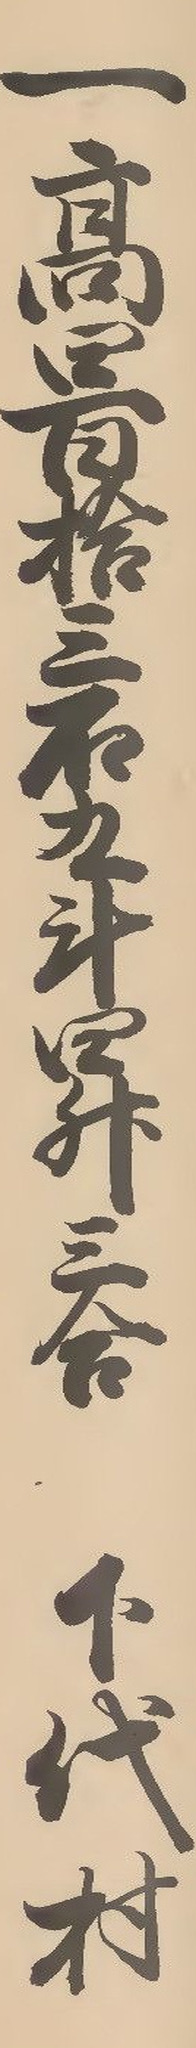一髙四百拾三石九斗四升三合下代村
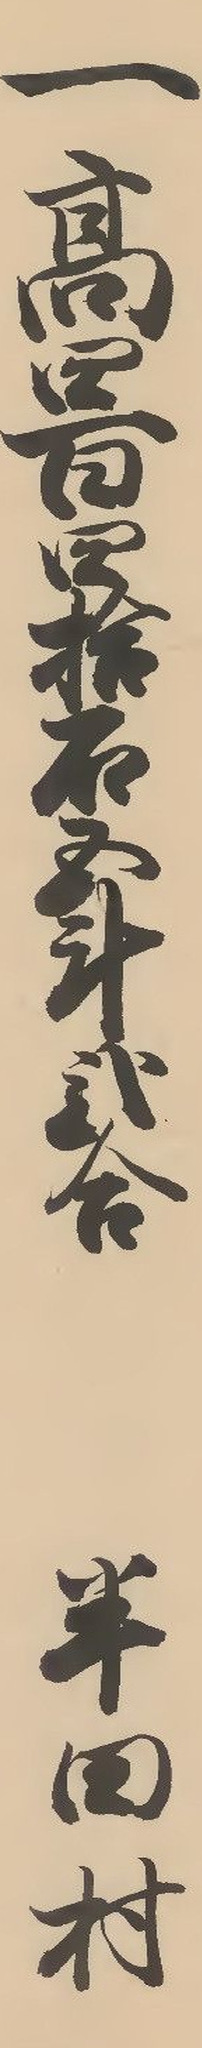一髙四百四拾石五斗弐合半田村
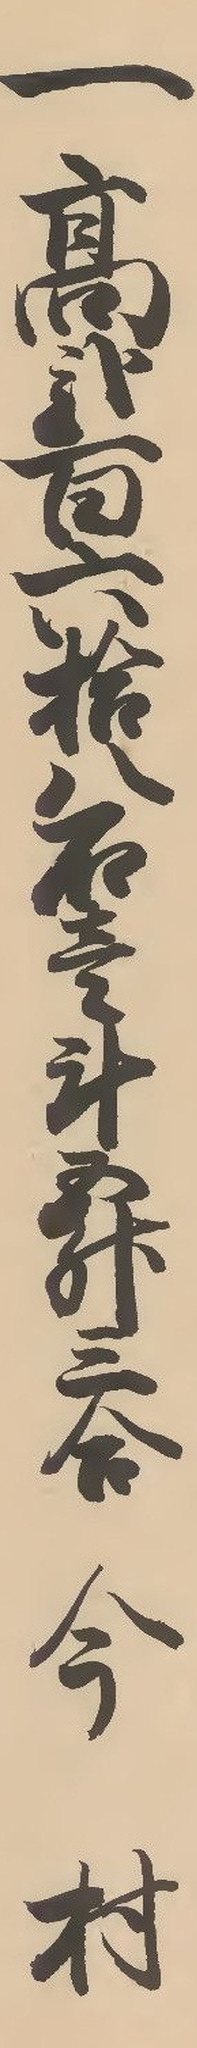一髙弐百六拾八石壱斗五升三合今村
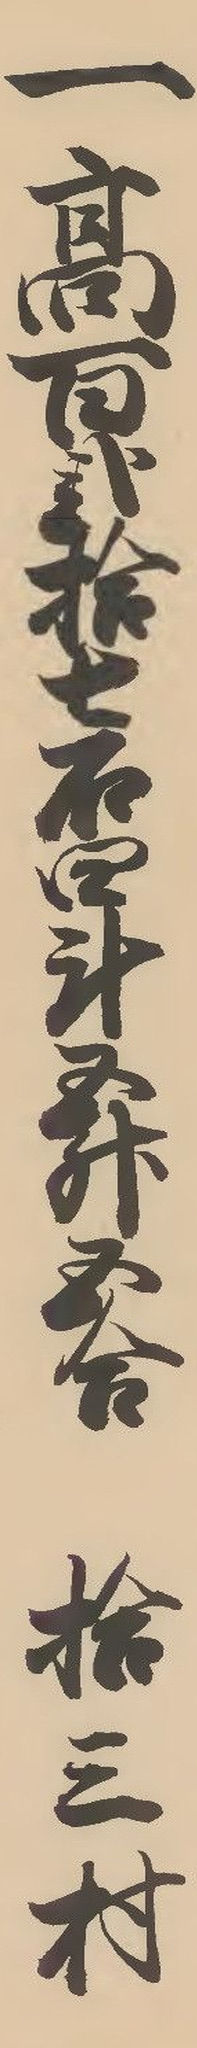一髙百弐拾七石四斗五升五合拾三村

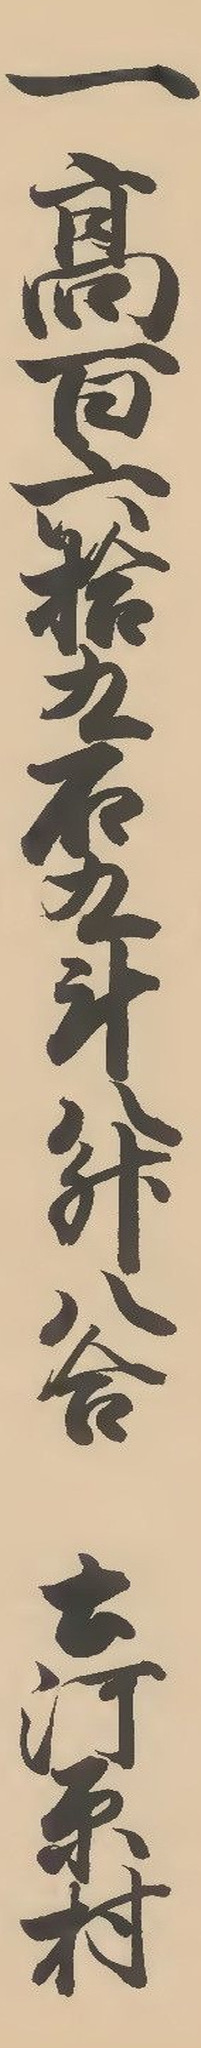一髙百六拾九石九斗八升八合土河原村
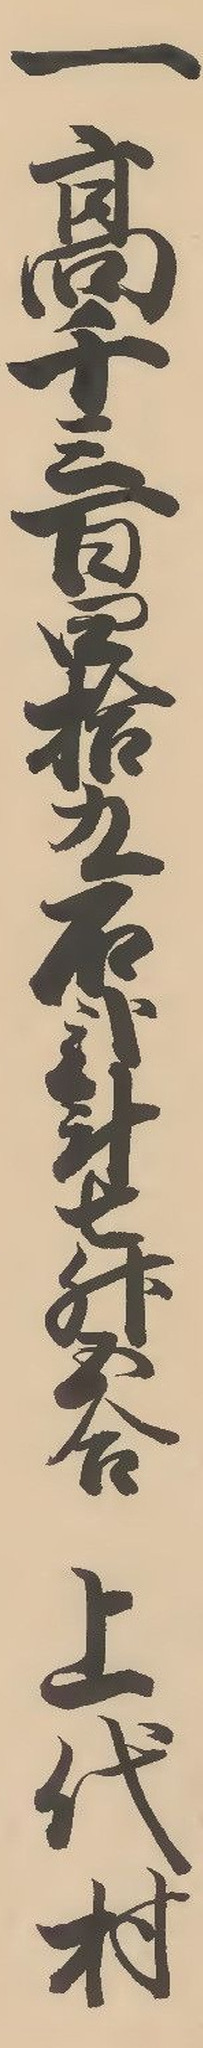一髙千三百四拾九石弐斗七升五合上代村
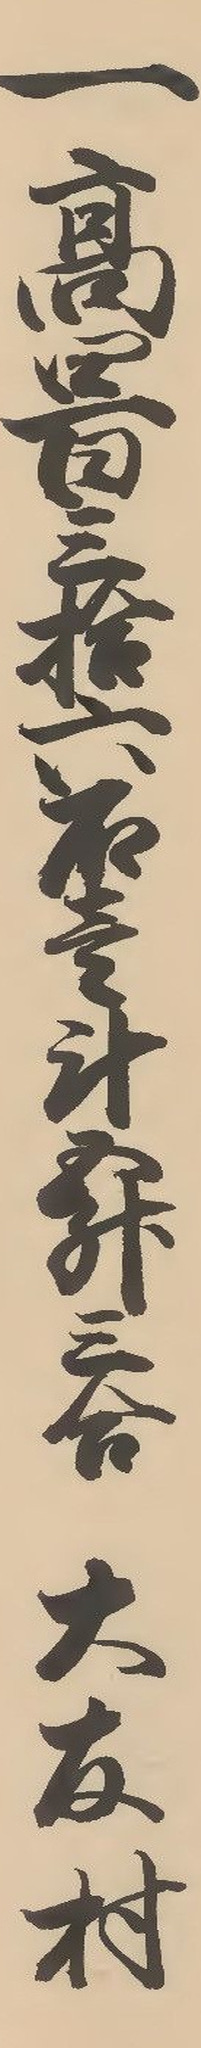一髙四百三拾六石壱斗五升三合大友村
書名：肥後国郷帳
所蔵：国立公文書館 National Archives of Japan
